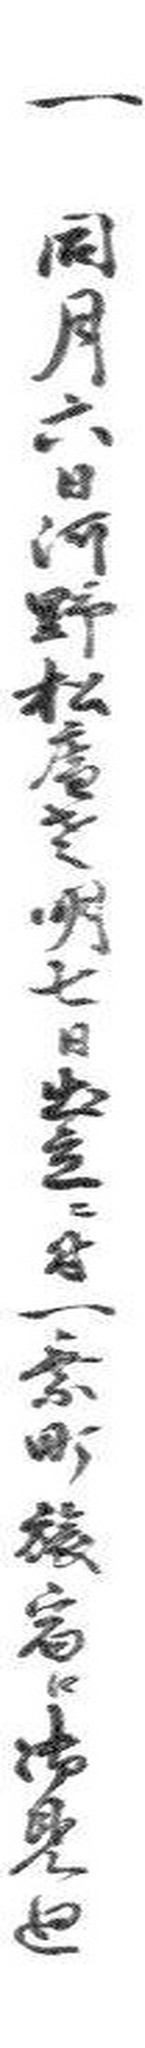一同月六日河野松庵老明七日出立ニ付一乗町旅宿江御見廻

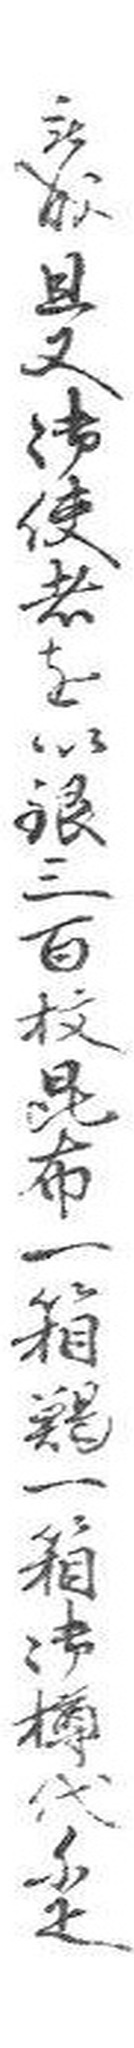被成且又御使者を以銀三百枚昆布一箱鯣一箱御樽代千疋
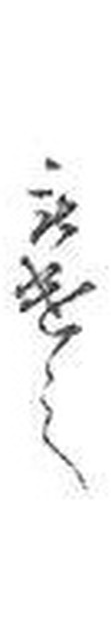被遣之
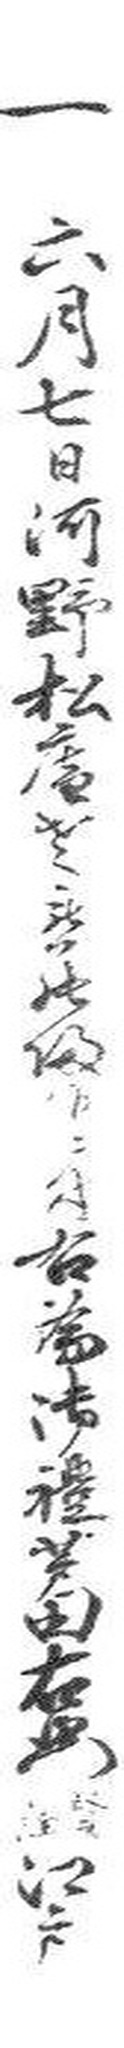一六月七日河野松庵老被罷帰候ニ付右為御礼芦田右衛門賢詮江戸
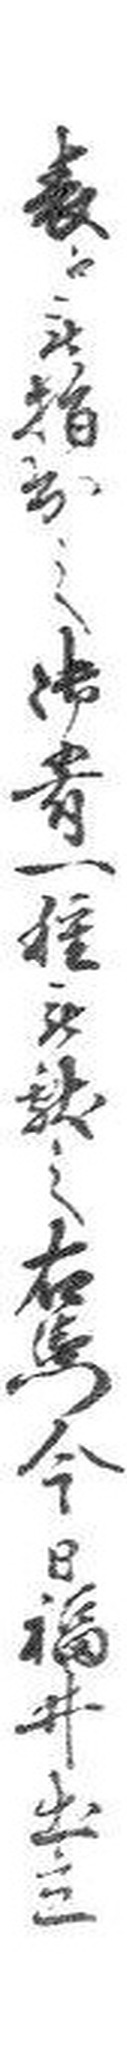表江被指出之御肴一種被献之右衛門今日福井出立
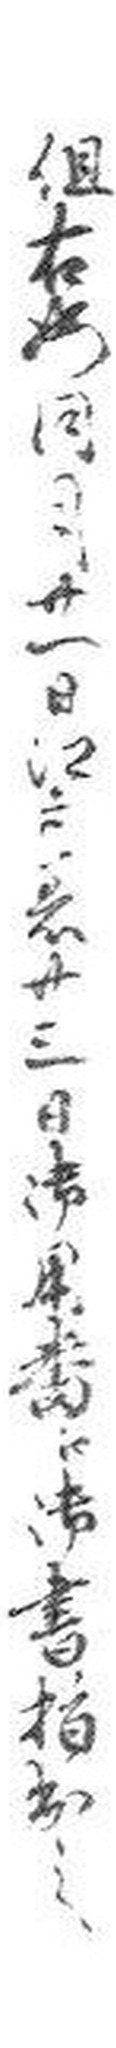但右衛門同月廿一日江戸着廿三日御用番江御書指出之
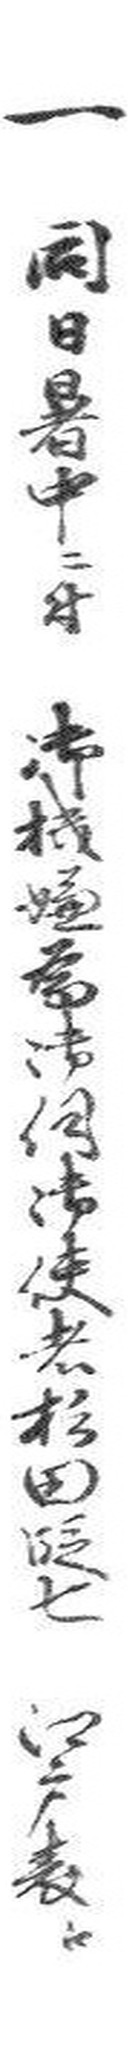一同日暑中ニ付御機嫌為御伺御使者杉田段七江戸表江
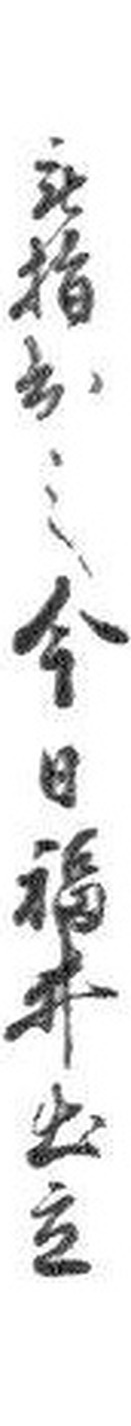被指出之今日福井出立
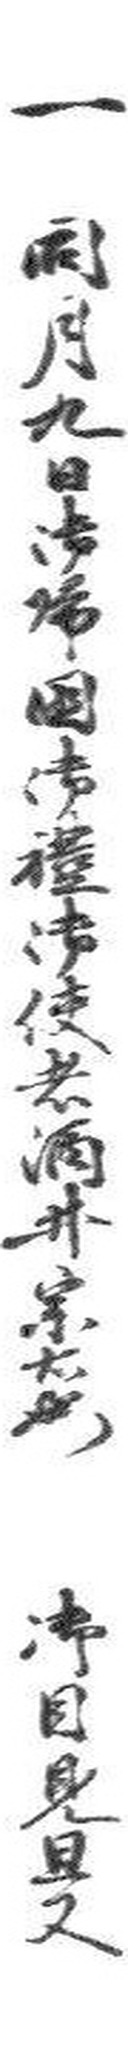一同月九日御帰国御礼御使者酒井宗右衛門御目見且又
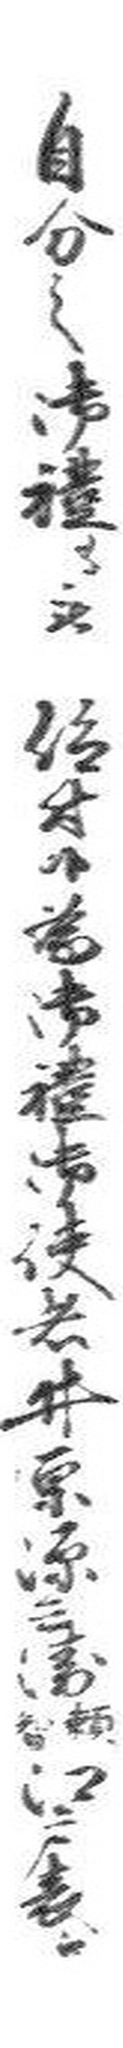自分之御礼も被仰付候為御礼御使者井原源兵衛頼智江戸表江
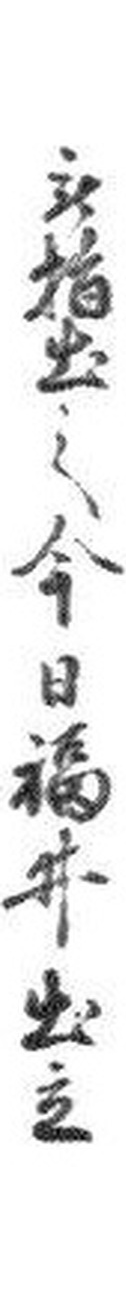被指出之今日福井出立
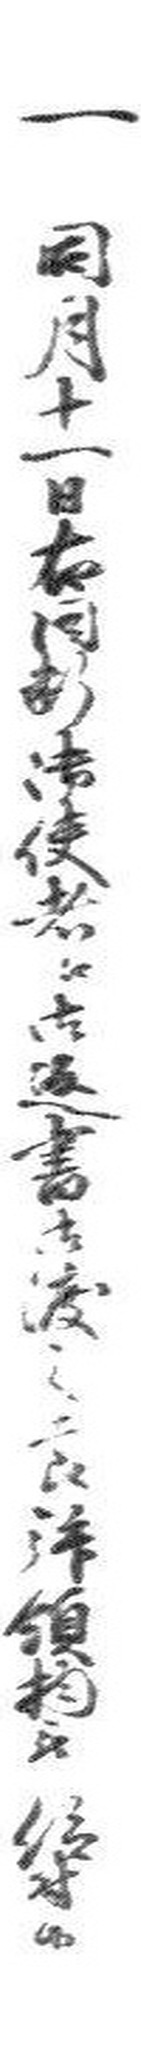一同月十一日右同断御使者江御返書御渡之節拝領被仰付候
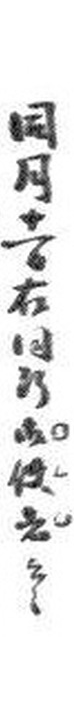同月十一日右同断御使者云々
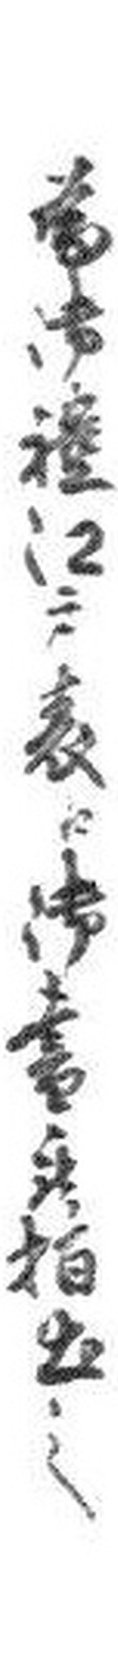為御礼江戸表江御書被指出之
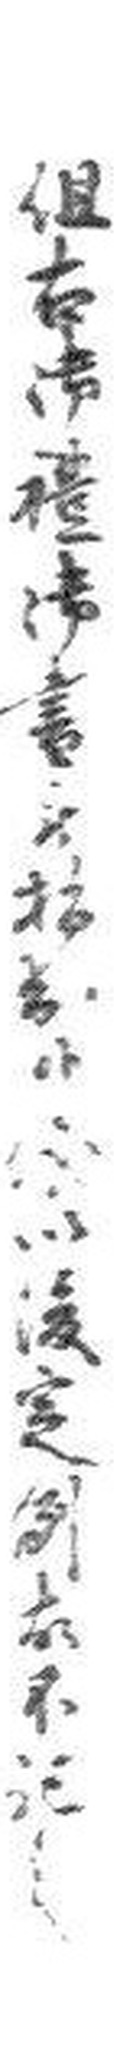但右御礼御書被指出候儀以後定例故不記之
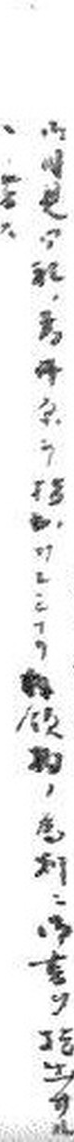御目見御礼ノ為井原ヲ指出サレシナリ拝領物ノ為別ニ御書ヲ指出サル
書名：家譜 二十八 吉邦公 従宝永七年七月五日到正徳元年十二月
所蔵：福井県文書館 Fukui Prefectural Archives
